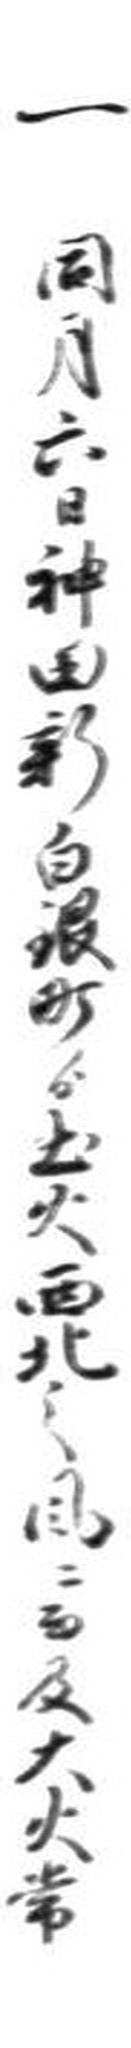一同月六日神田新白銀町ゟ出火西北之風ニ而及大火常
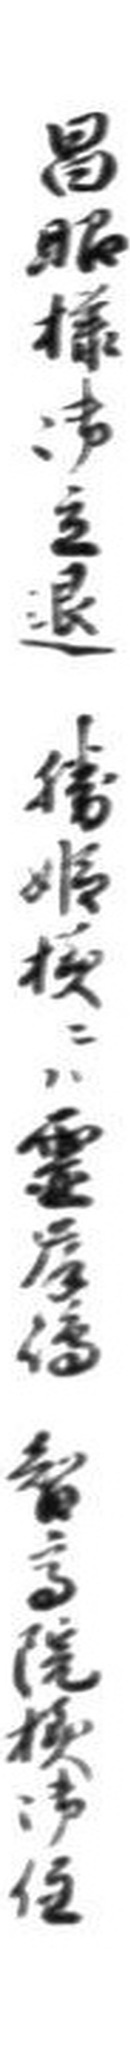昌昭様御立退勝姫様ニハ霊岸嶋智高院様御住

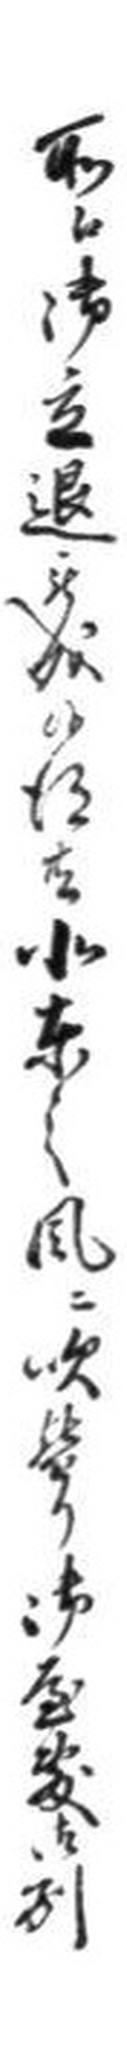所江御立退被成候得共北東之風ニ吹替り御屋敷御別
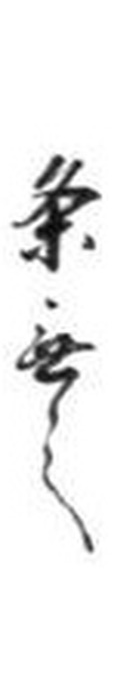条無之
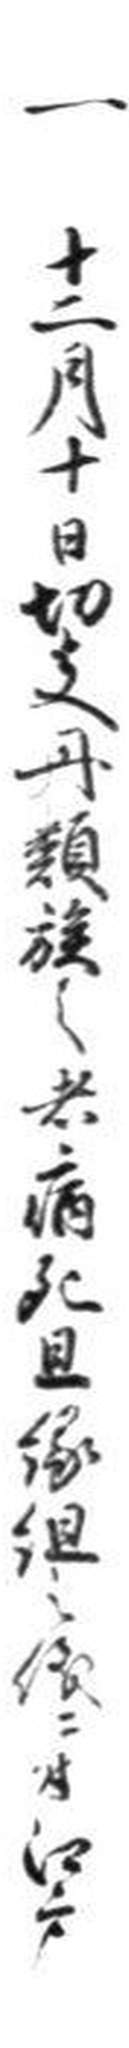一十二月十日切支丹類族之者病死且縁組之儀ニ付江戸
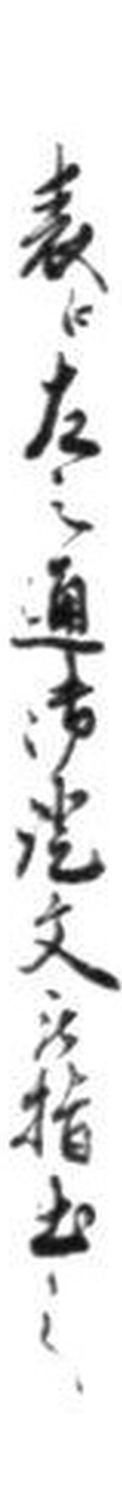表江左之通御証文被指出之
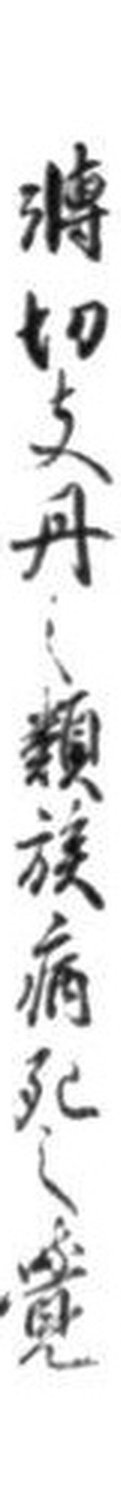転切支丹類族病死之覚
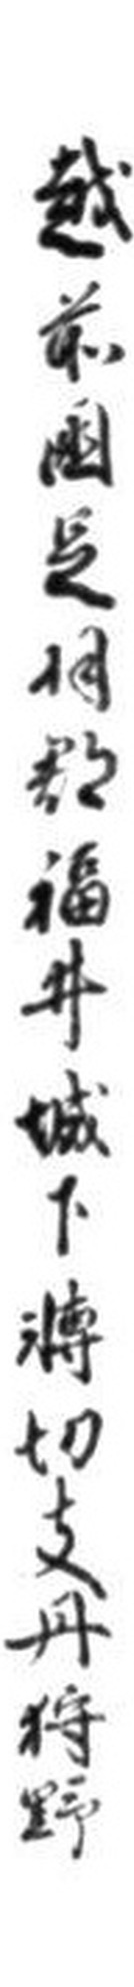越前国足羽郡福井城下転切支丹狩野
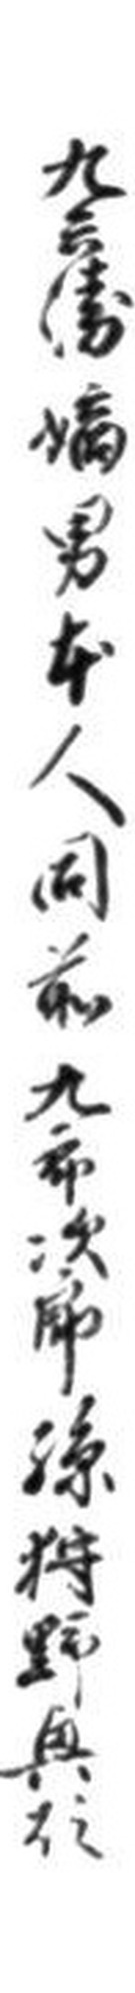久兵衛嫡男本人同前九郎次郎孫狩野興碩
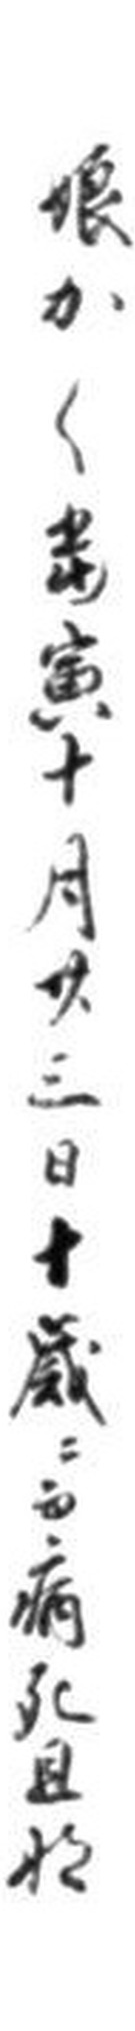娘かく当寅十月廿三日十歳ニ而病死旦那
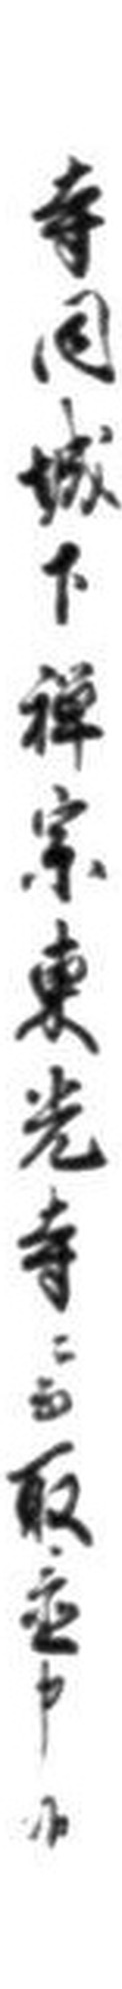寺同城下禅宗東光寺ニ而取置申候
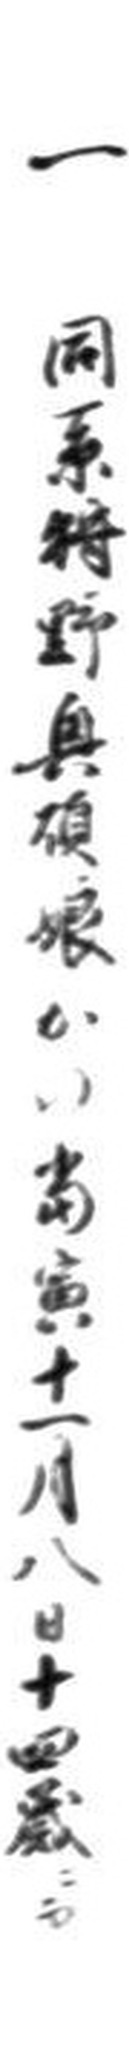一同系狩野興碩娘かの当寅十一月八日十四歳ニ而
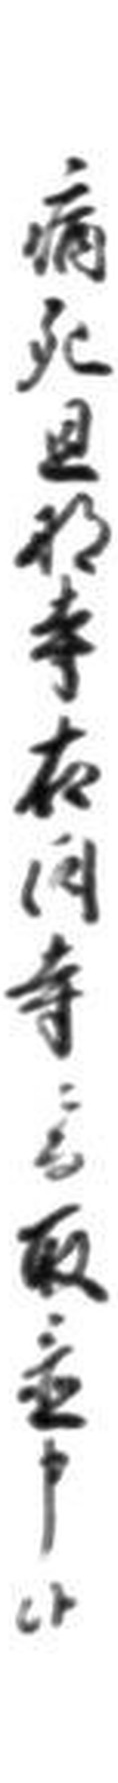病死旦那寺右同寺ニ而取置申候
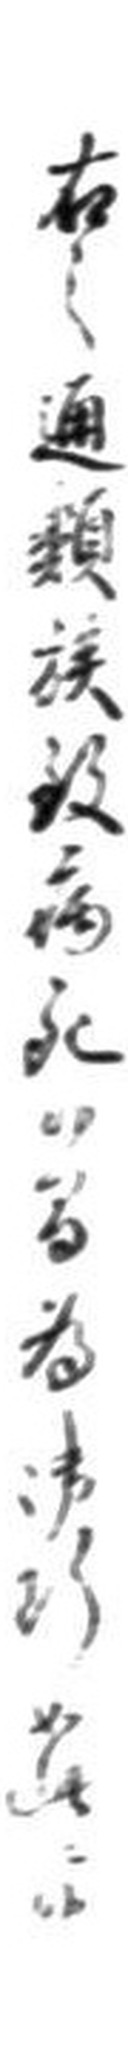右之通類族致病死候間為御断如此ニ候
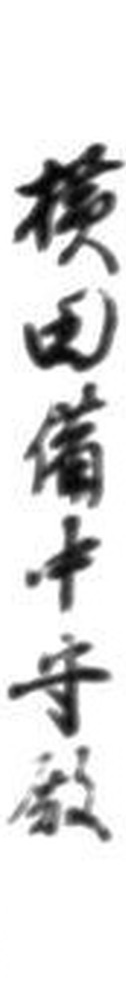横田備中守殿

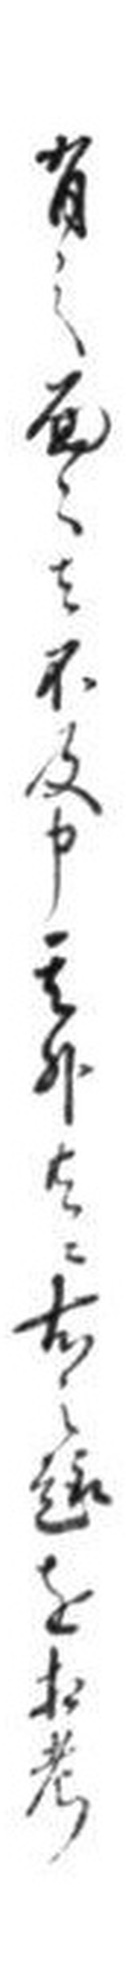有之面々者不及申其外共ニ右之趣を相考
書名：家譜 三十五 宗昌公 従享保六年到同七年
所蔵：福井県文書館 Fukui Prefectural Archives
